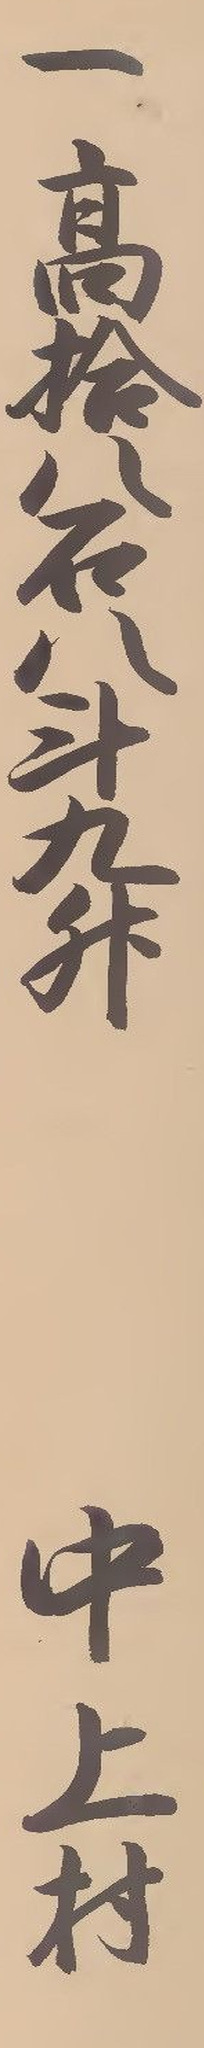一髙拾八石八斗九升中上村
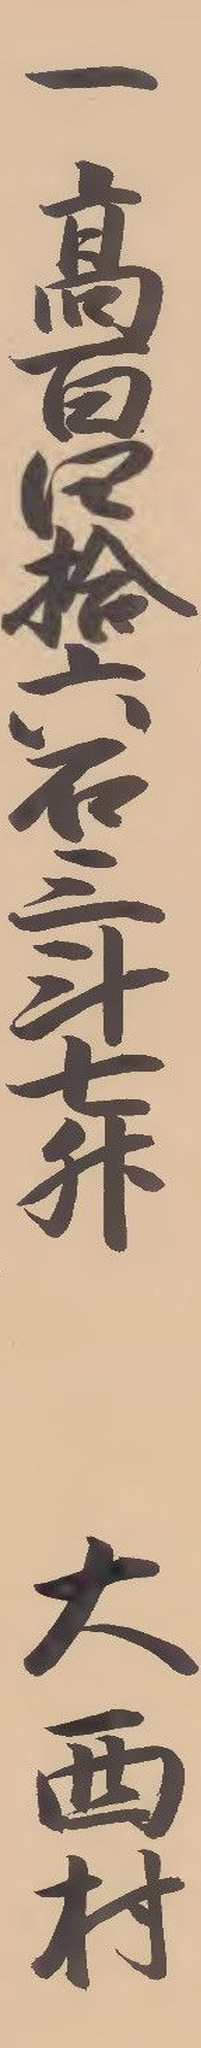一髙百四拾六石三斗七升大西村

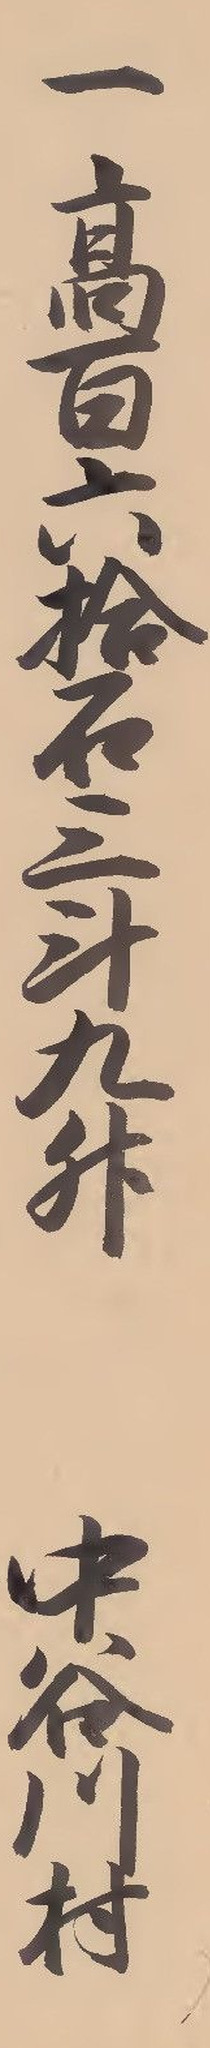一髙百六拾石三斗九升中谷川村
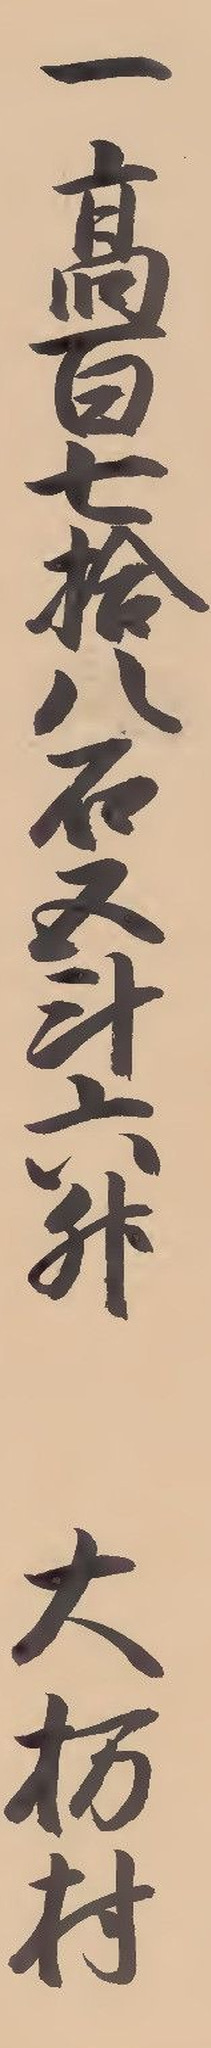一髙百七拾八石五斗六升大杤村
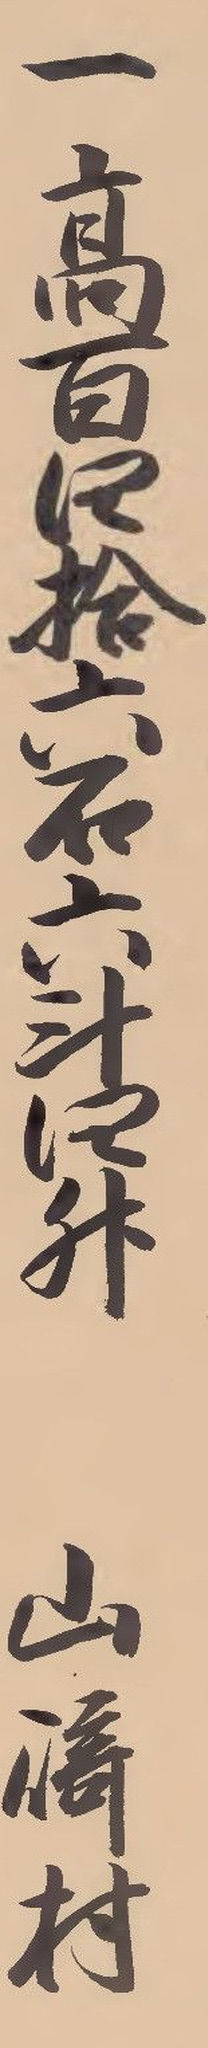一髙百四拾六石六斗四升山崎村
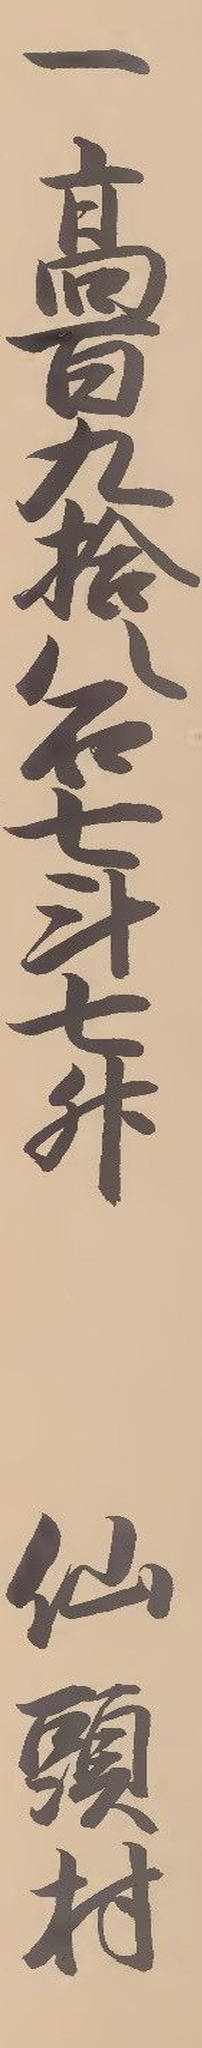一髙百九拾八石七斗七升仙頭村
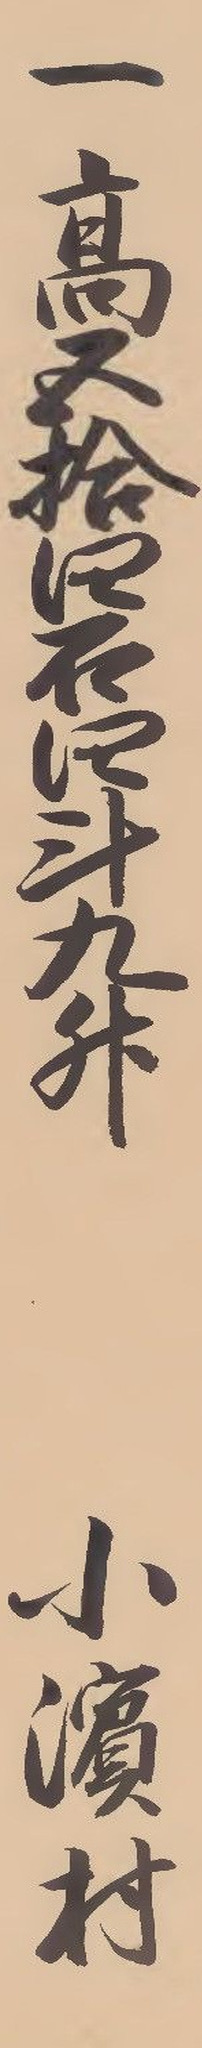一髙五拾四石四斗九升小濱村
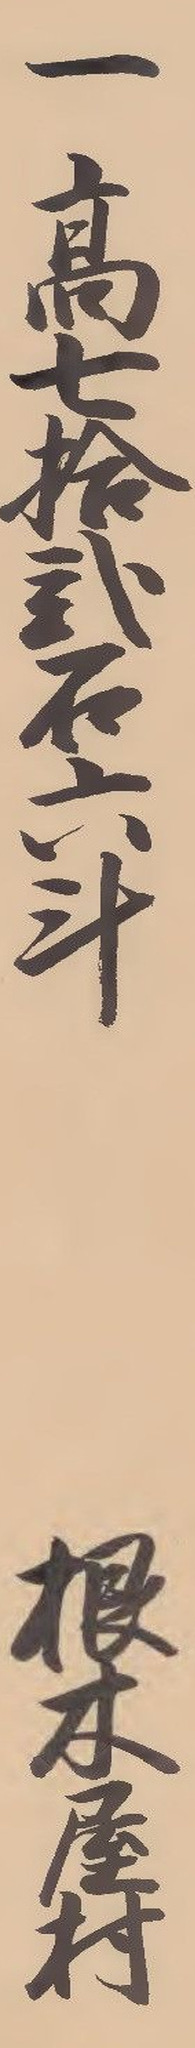一髙七拾弐石六斗根木屋村

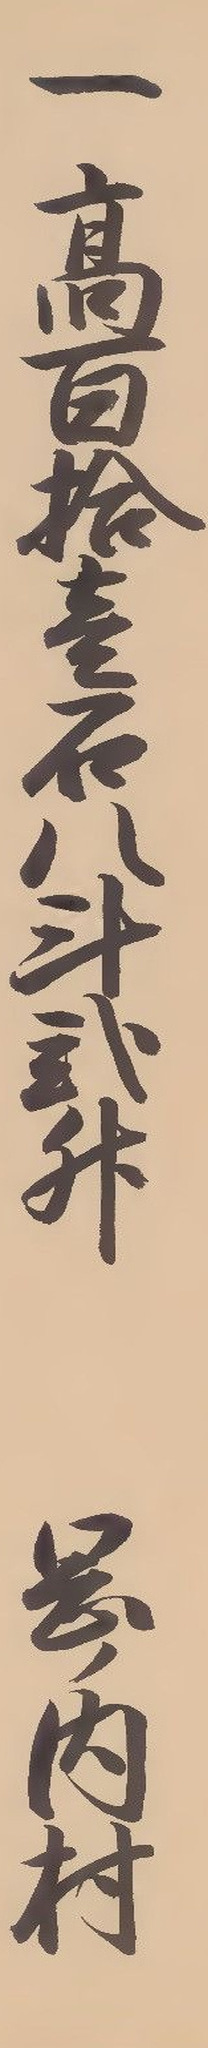一髙百拾壱石八斗弐升岡ノ内村
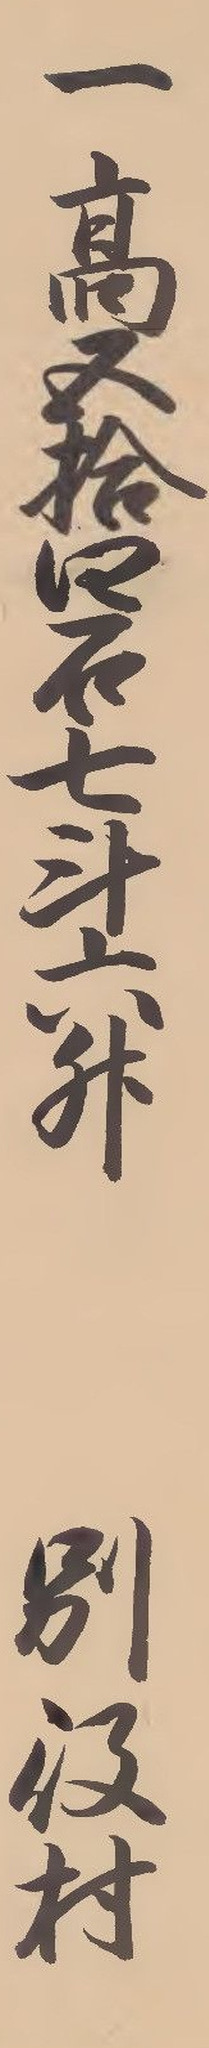一髙五拾四石七斗六升別役村
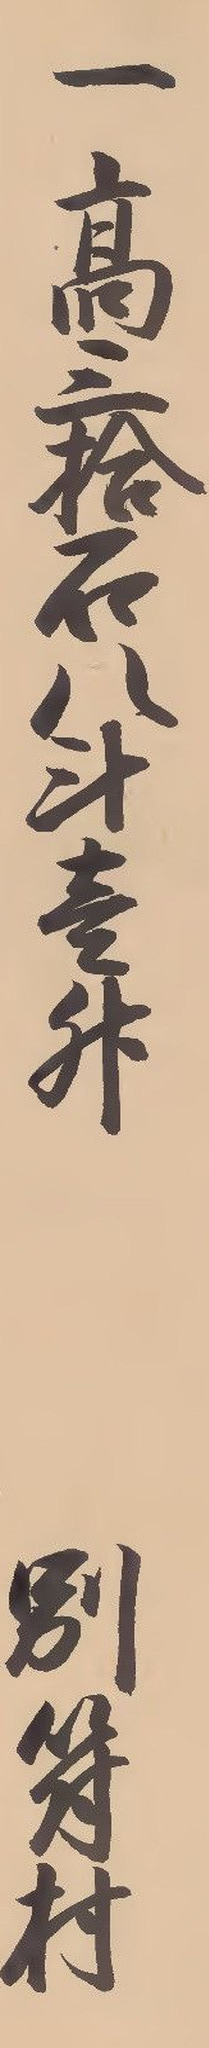一髙三拾石八斗壱升別符村
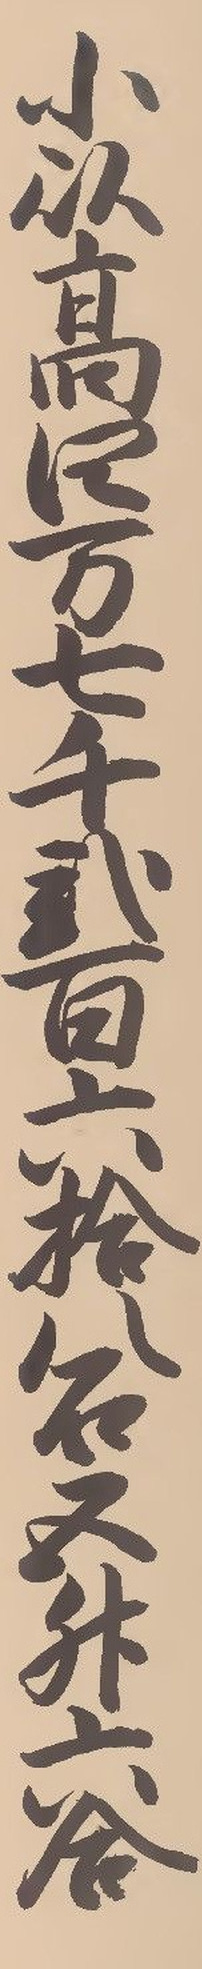小以髙四万七千弐百六拾八石五升六合

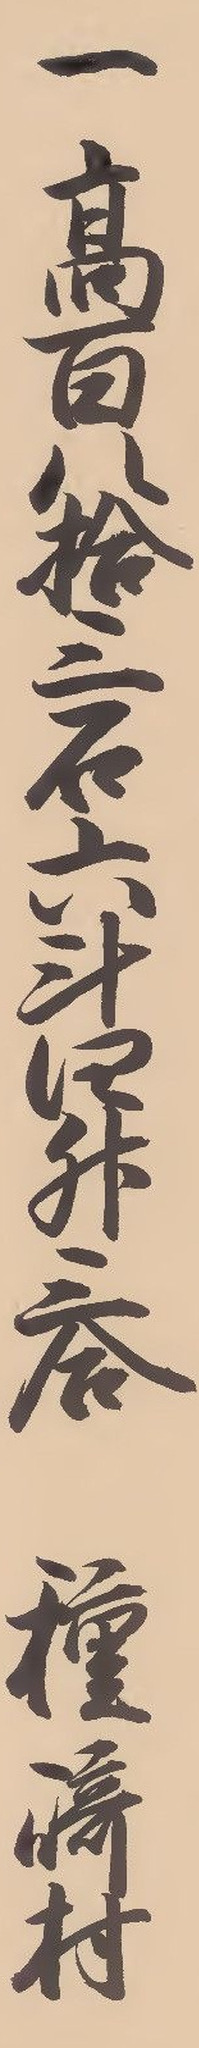一髙百八拾三石六斗四升三合種崎村
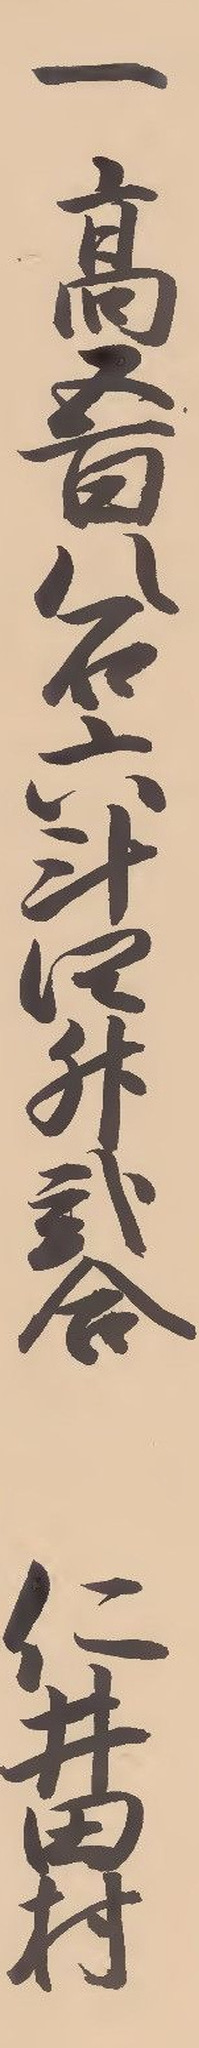一髙五百八石六斗四升弐合仁井田村
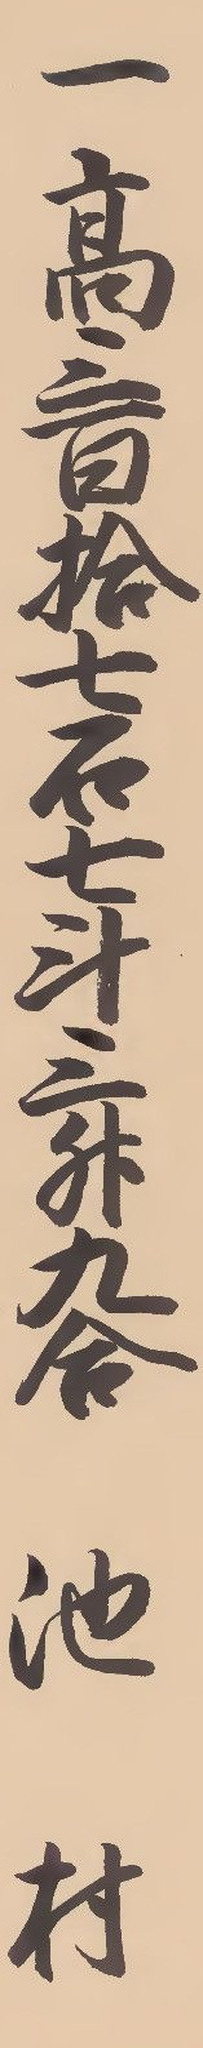一髙三百拾七石七斗三升九合池村
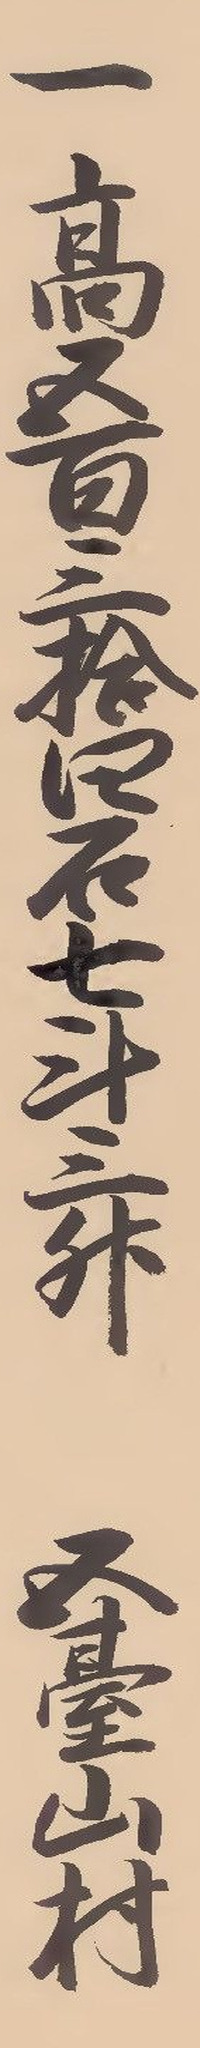一髙五百三拾四石七斗三升五臺山村
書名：土佐国郷帳
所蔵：国立公文書館 National Archives of Japan
